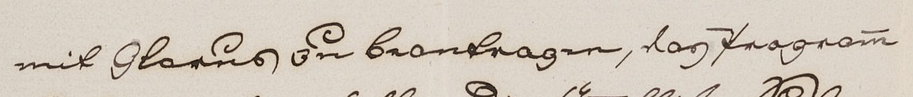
mit Glarus zu beantragen, das Programm
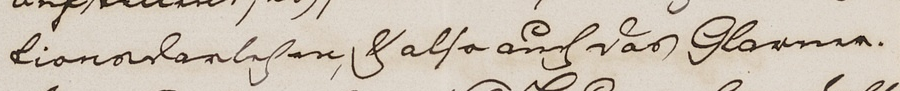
tionsdarlehen, & also auch das Glarner-
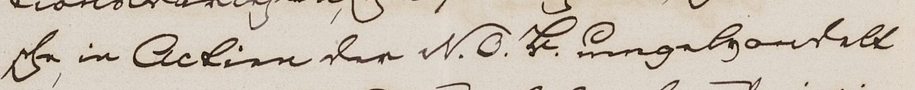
sche in Actien der N.O.B. umgewandelt
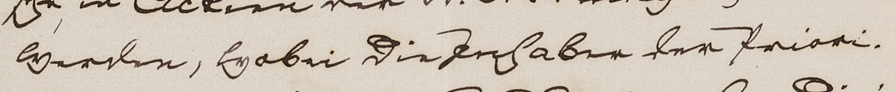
werden, wobei die Inhaber der Priori-
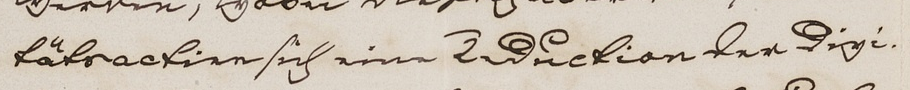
tätsactien sich eine Reduction der Divi-
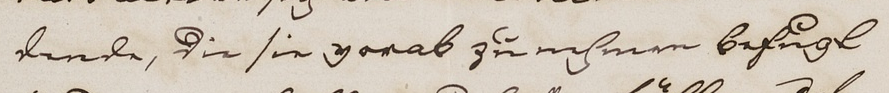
dende, die sie vorab zu nehmen befugt
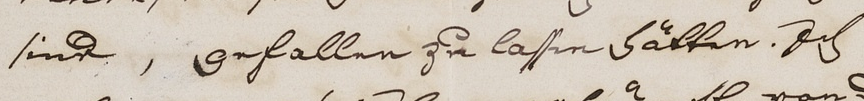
sind, gefallen zu lassen hätten. Ich
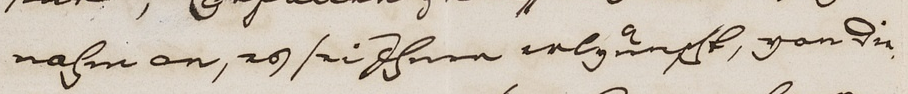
nahm an, es sei Ihnen erwünscht, von die-
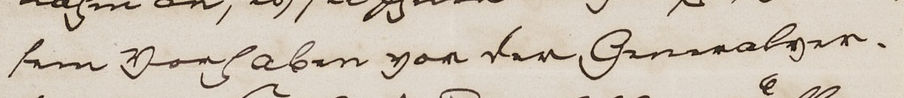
sem Vorhaben vor der Generalver-
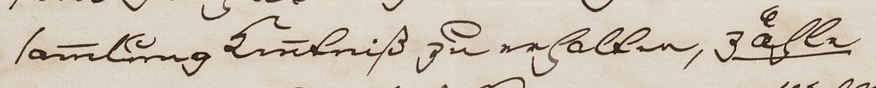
sammlung Kenntniß zu erhalten, zähle
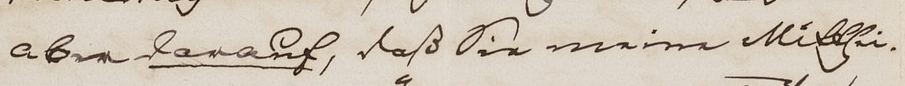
aber darauf, daß Sie meine Mitthei-
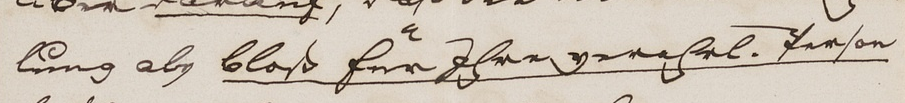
lung als bloß für Ihre verehrl. Person
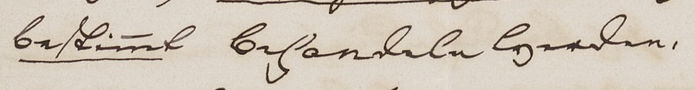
bestimmt behandeln werden.
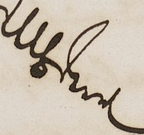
Escher
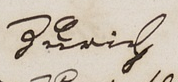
Zürich
